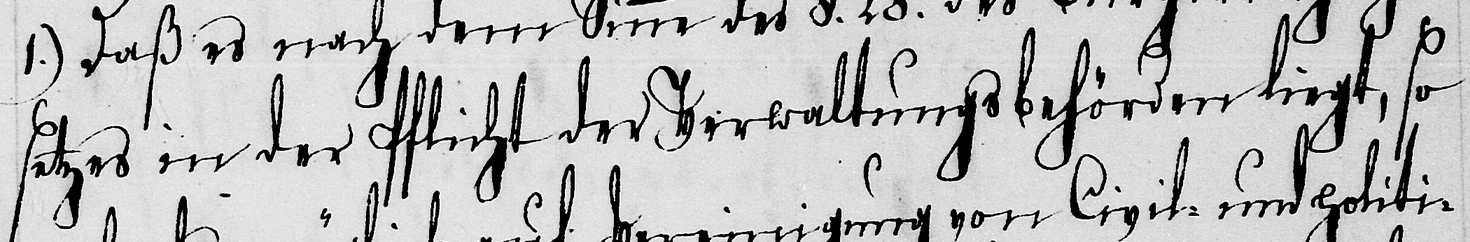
setzes in der Pflicht der Verwaltungsbehörden liegt, so
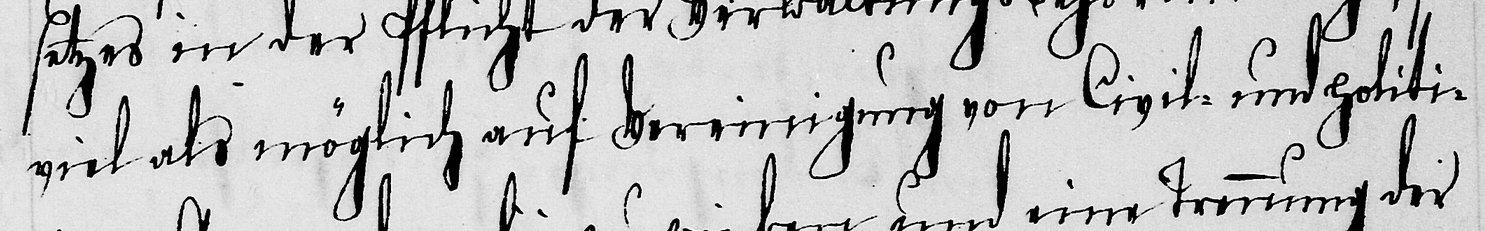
viel als möglich auf Vereinigung von Civil- und politi¬
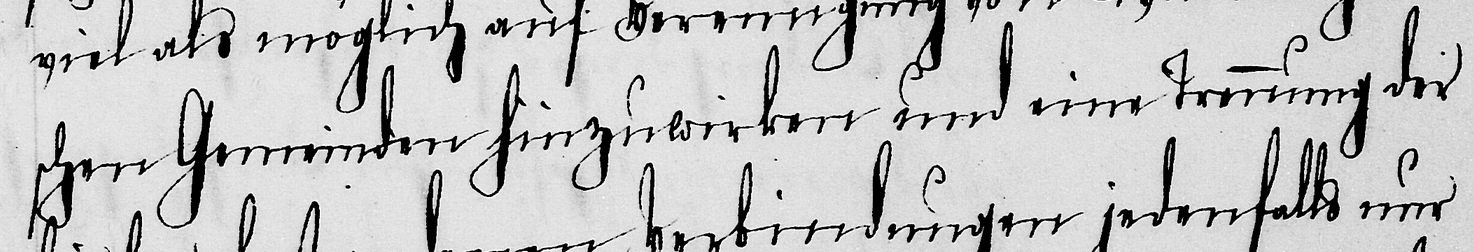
schen Gemeinden hinzuwirken und eine Trennung der
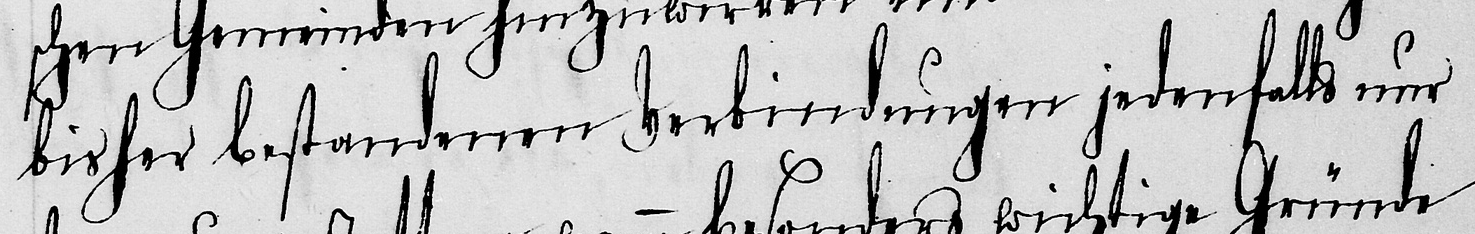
bisher bestandenen Verbindungen jedenfalls nur
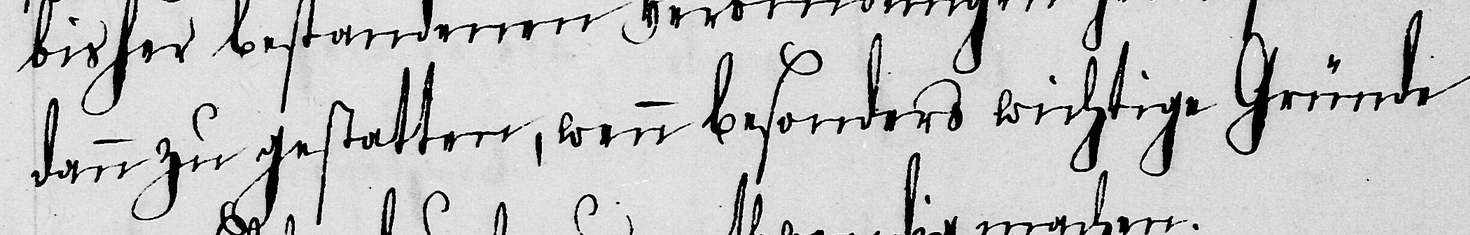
dann zu gestatten, wenn besonders wichtige Gründe
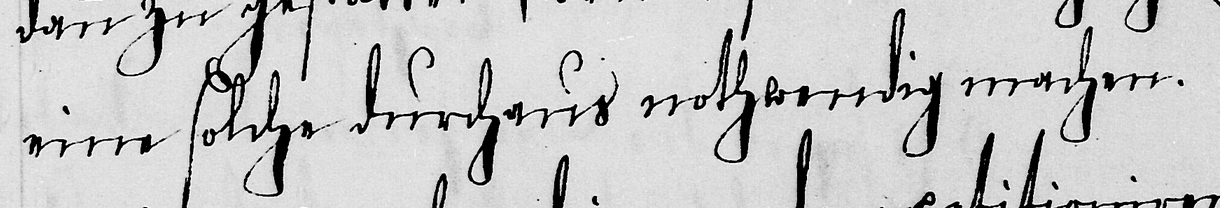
eine solche durchaus nothwendig machen.
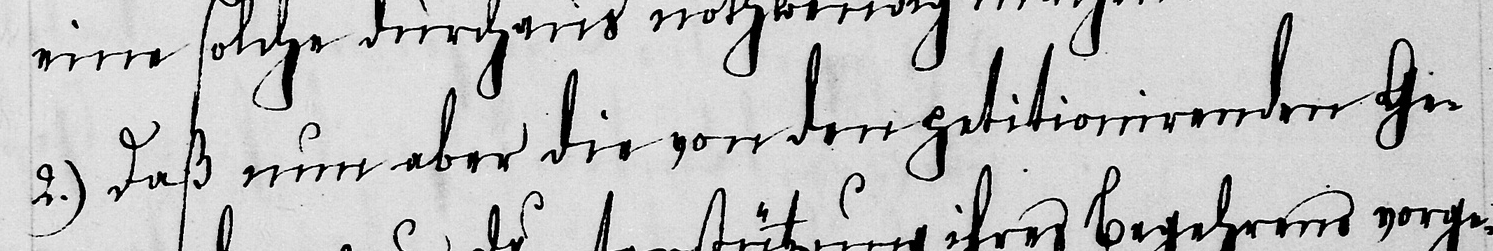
2.) Daß nun aber die von den petitionirenden Ge¬
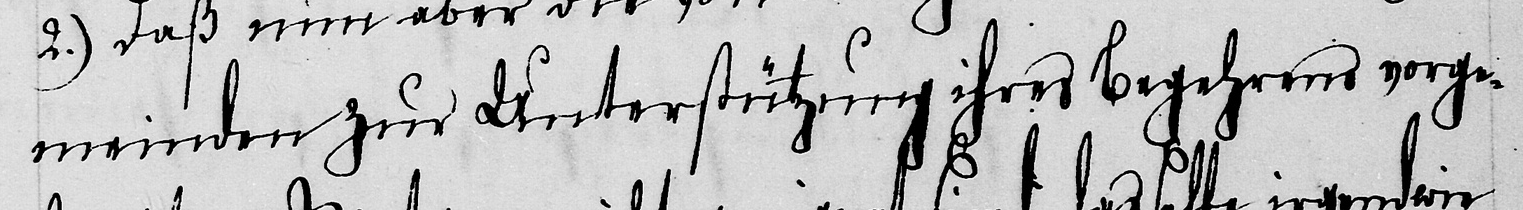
meinden zur Unterstützung ihres Begehrens vorge¬
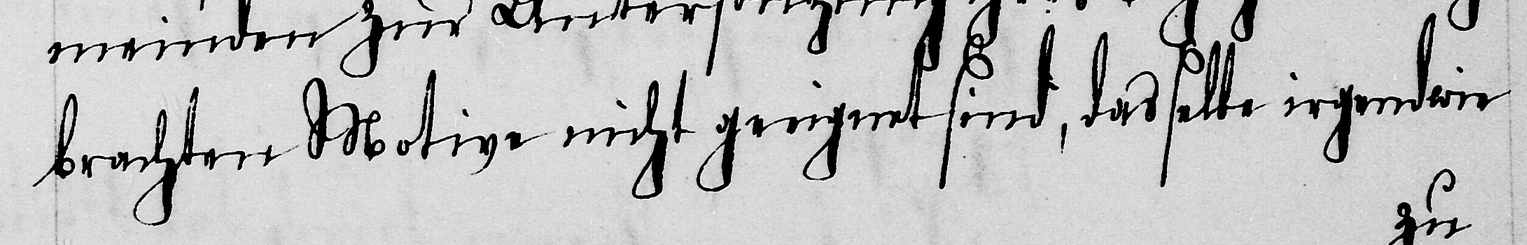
brachten Motive nicht geeignet sind, dasselbe irgendwie
